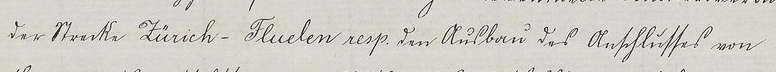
der Strecke Zürich–Fluelen resp. den Ausbau des Anschlusses von
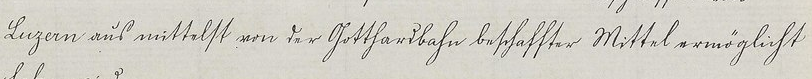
Luzern aus mittelst von der Gotthardbahn beschaffter Mittel ermöglicht
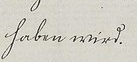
haben wird.
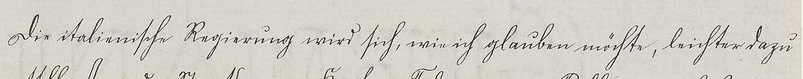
Die italienische Regierung wird sich, wie ich glauben möchte, leichter dazu
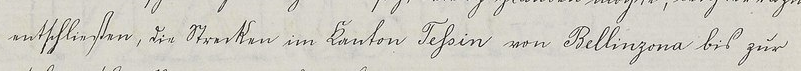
entschließen, die Strecken im Kanton Tessin von Bellinzona bis zur
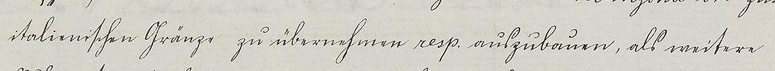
italienischen Gränze zu übernehmen resp. auszubauen, als weitere
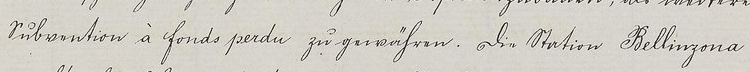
Subvention à fonds perdu zu gewähren. Die Station Bellinzona
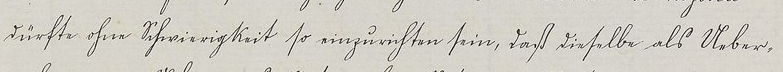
dürfte ohne Schwierigkeit so einzurichten sein, daß dieselbe als Ueber-
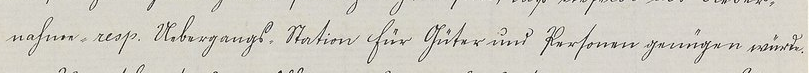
nahme- resp. Uebergangs-Station für Güter und Personen genügen würde.
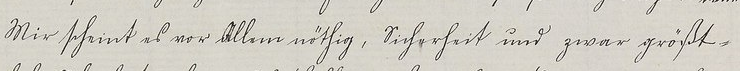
Mir scheint es vor Allem nöthig, Sicherheit und zwar größt-
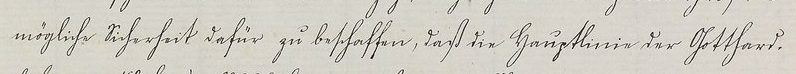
mögliche Sicherheit dafür zu beschaffen, daß die Hauptlinie der Gotthard -
